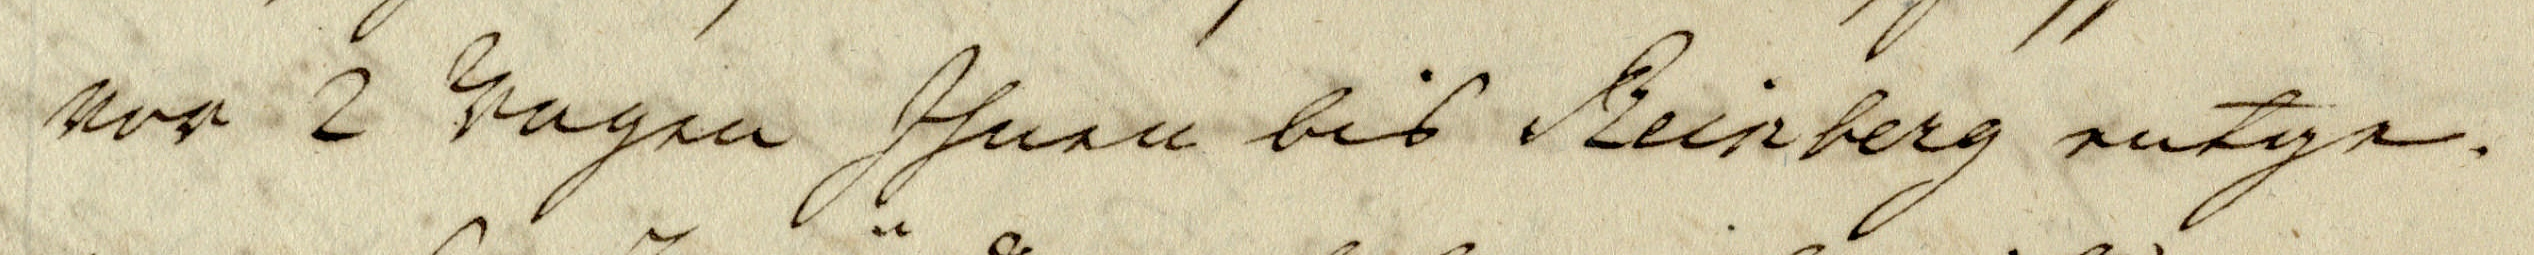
vor 2 Wagen Ihnen bis Reinberg entge¬
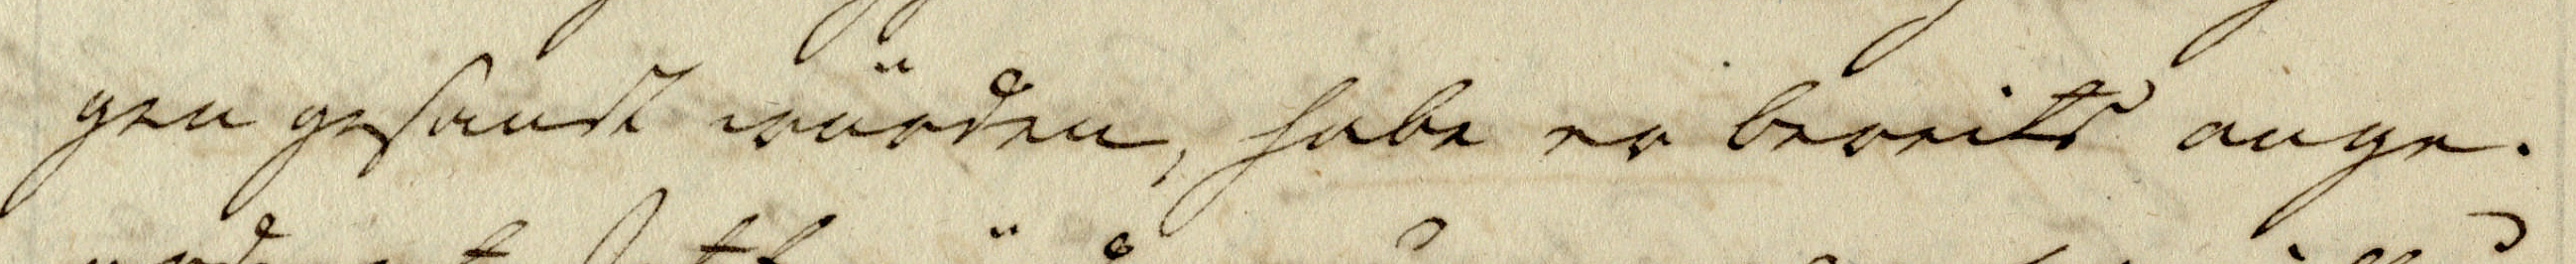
gen gesandt würden, habe er bereits ange¬
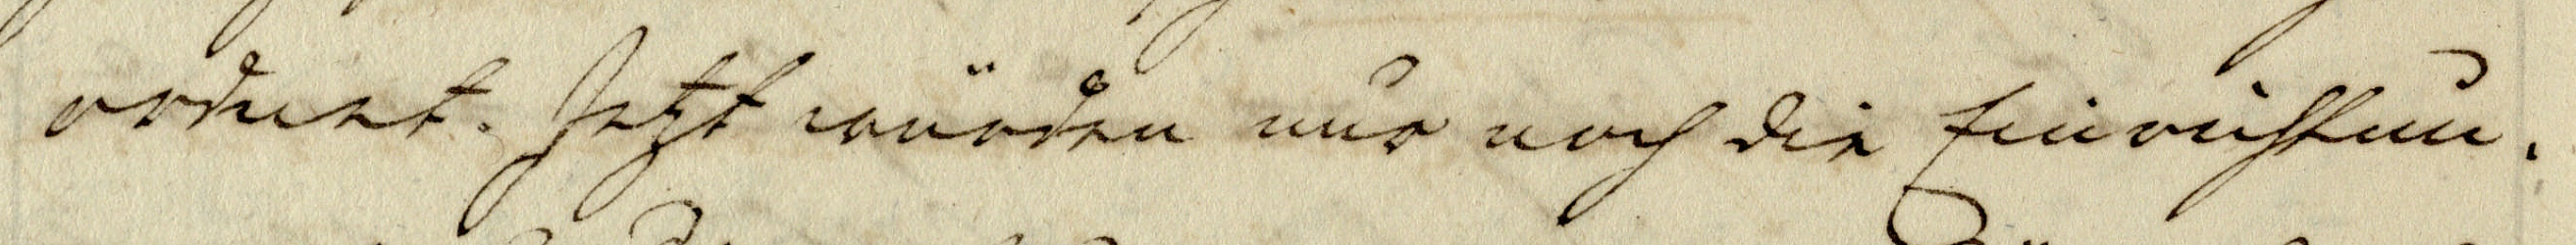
ordnet. jetzt würden nur noch die Einrichtun¬
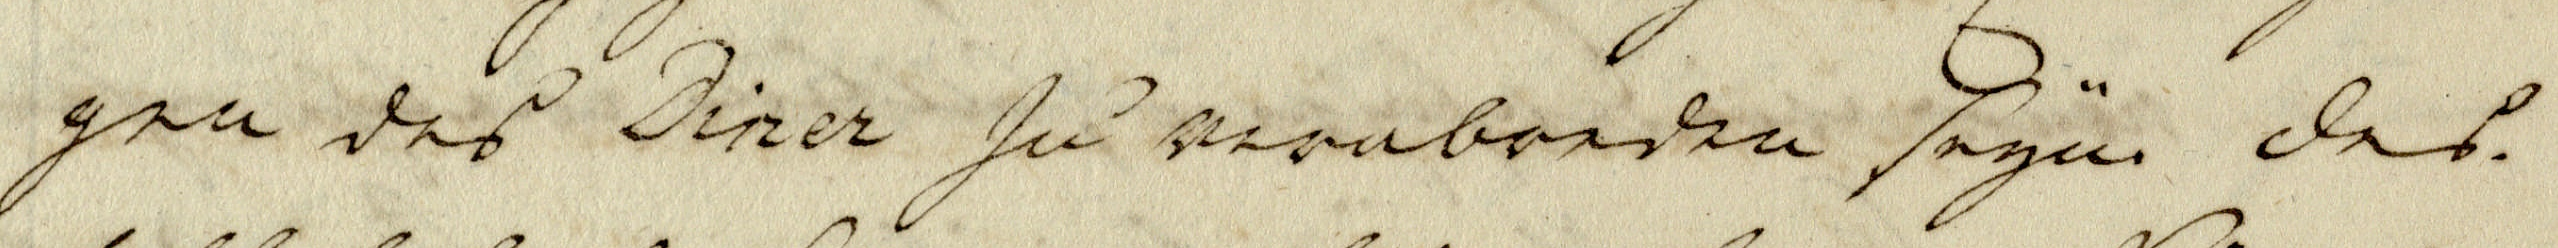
gen des Diner zu verabreden seÿn. Des¬
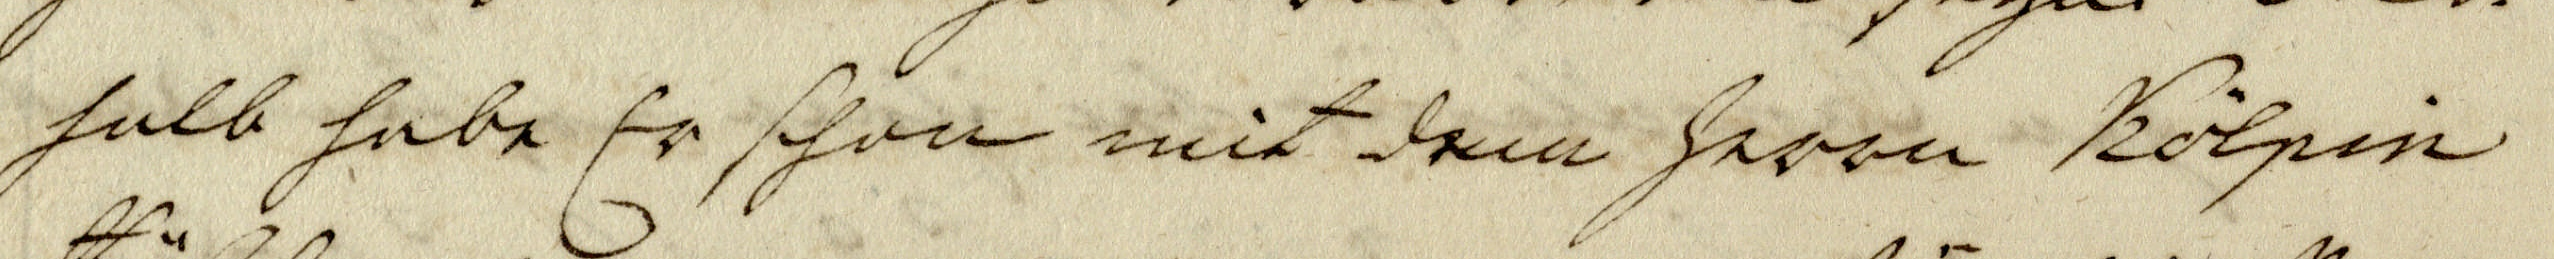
halb habe Er schon mit dem Herrn Kölpin
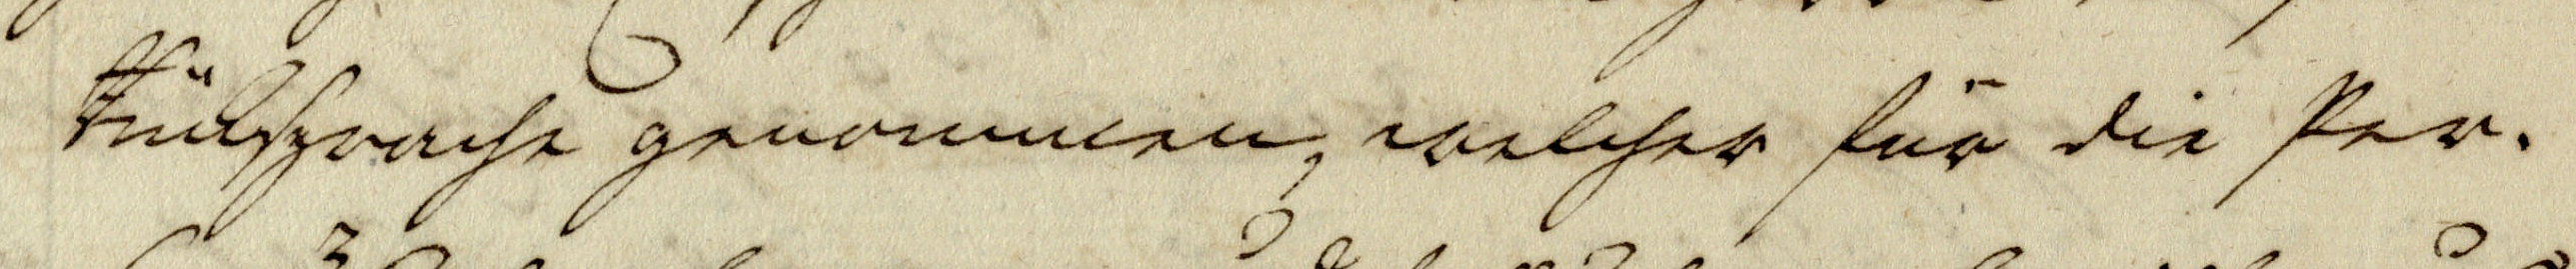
Rücksprache genommen, welcher für die Per¬
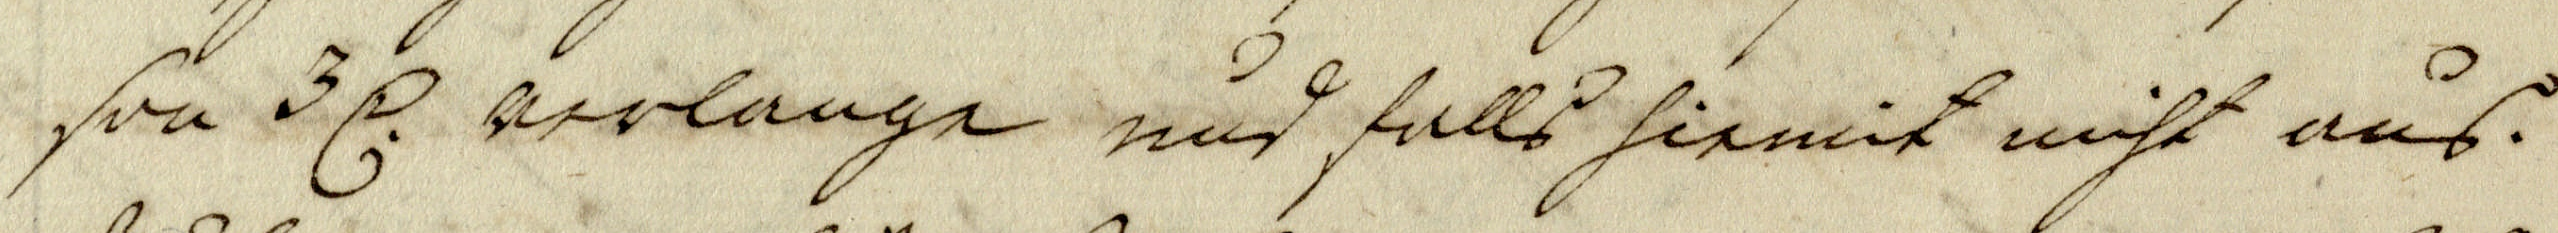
son 3l . verlange und falls hiemit nicht aus¬
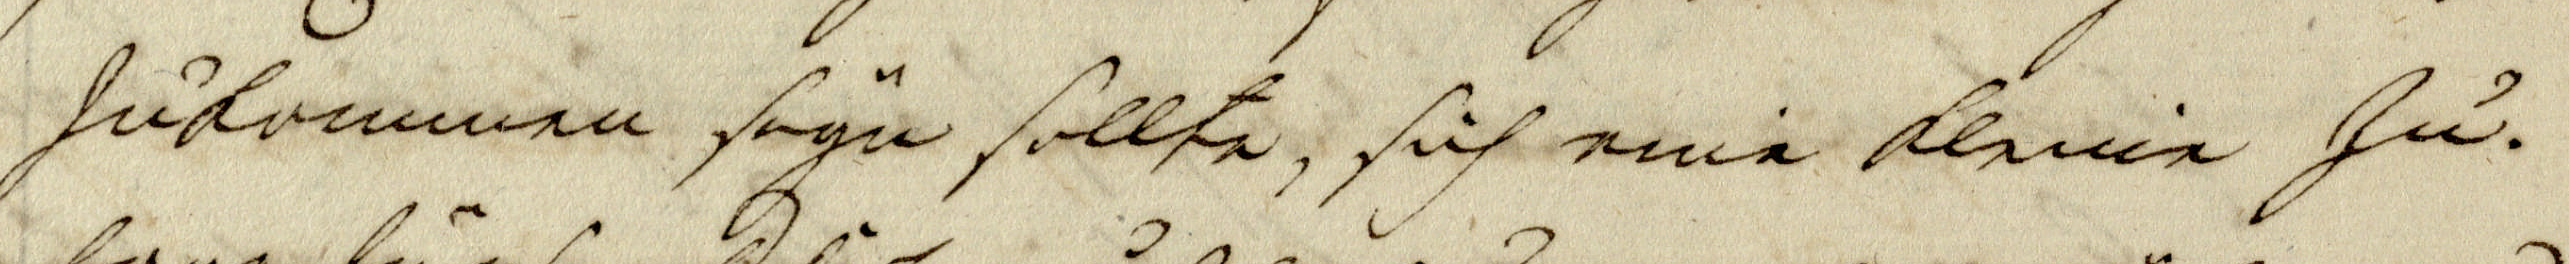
zukommen seÿn sollte, sich eine kleine Zu¬
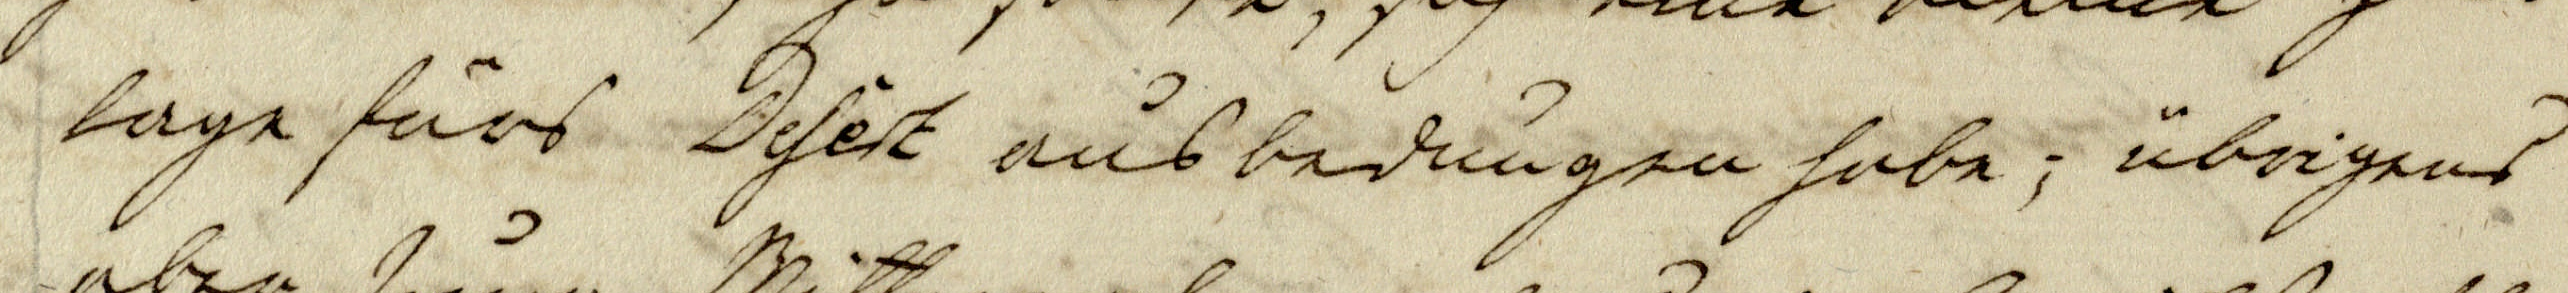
lage fürs Desert aus bedungen habe; übrigens
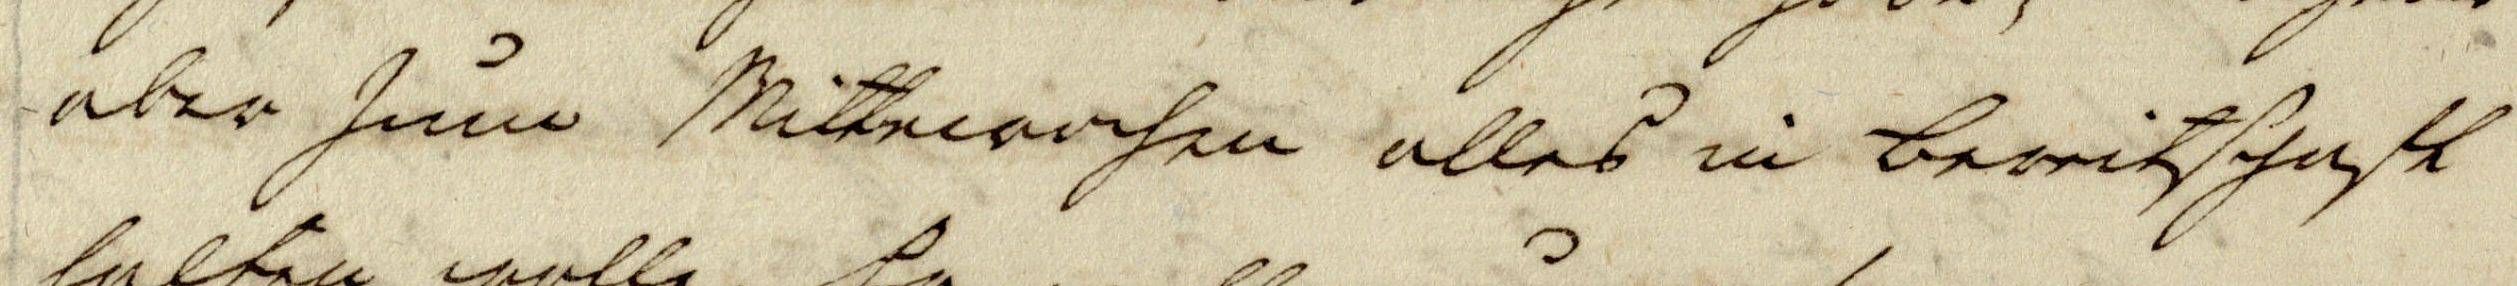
aber zum Mittewochen alles in Bereitschaft
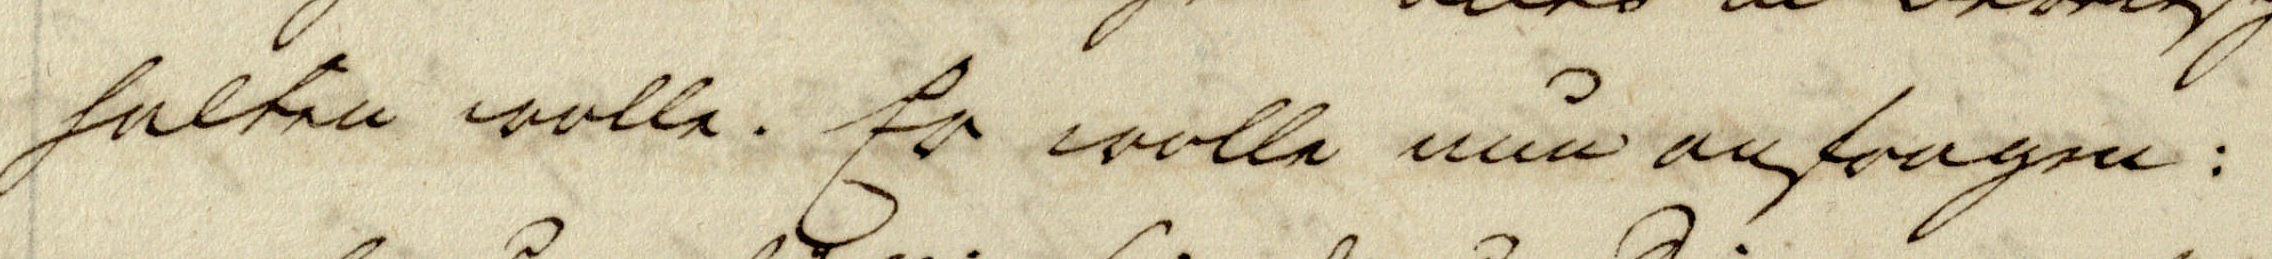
halten wolle. Er wolle um anfragen:
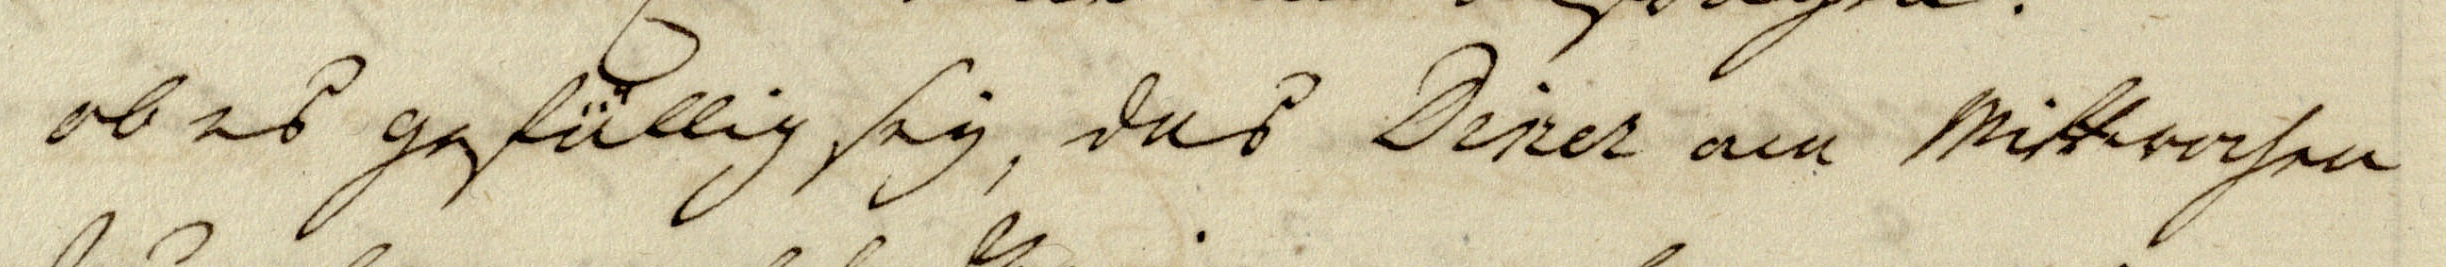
ob es gefällig seÿ, das Diner am Mittwochen
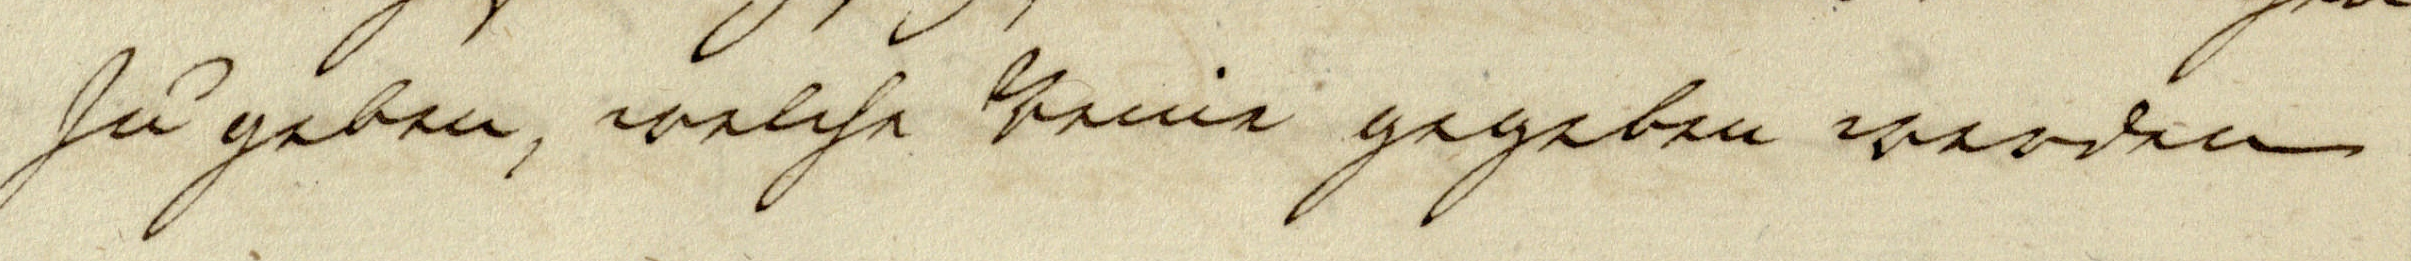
zu geben, welche Weine gegeben werden
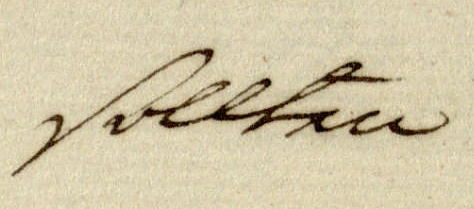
sollten
